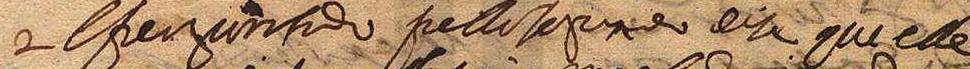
2 E perguntado pello segundo dise que elle
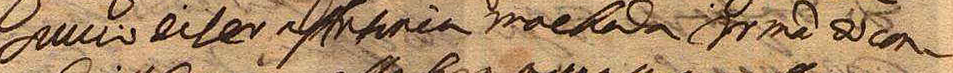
ouuio diser a Antonia machada jrmā do con
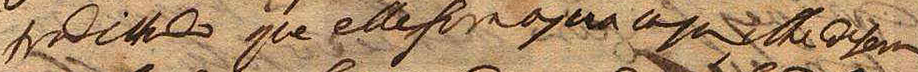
tradittado que elle fora a sua casa, e lhe disera
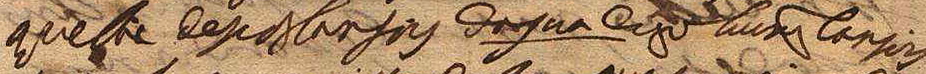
que lhe dese os lansois da sua digo huns lansois
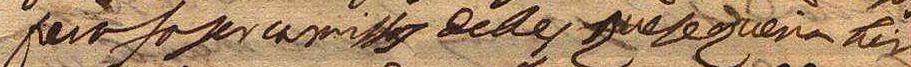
pera faser camissas delles que se queria hir
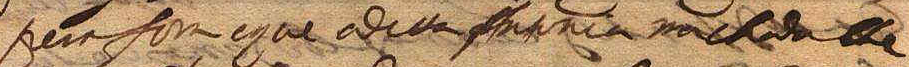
pera fora e que a ditta Antonia machada lhe
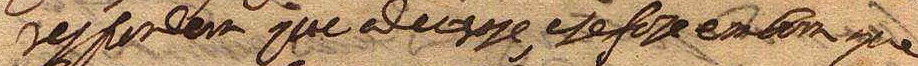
respondera que a deixase, e se fose embora que
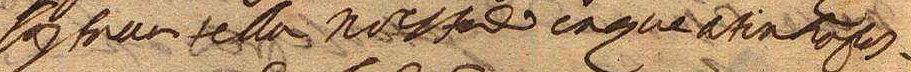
bastaua tella no estado en que a tinha pos
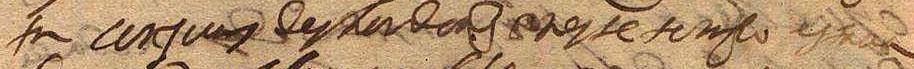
ta con suas deshordens e neste tenpo estaua
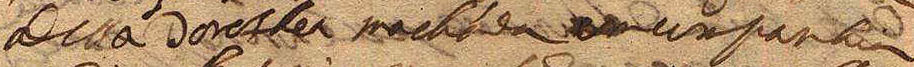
a ditta Dorothea machada em conpanhia
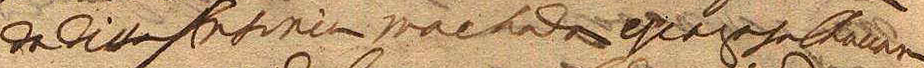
da ditta Antonia machada e se agasalhauam
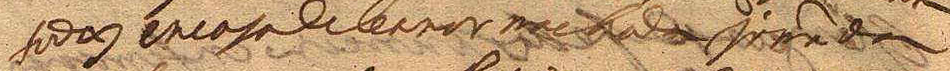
todas en casa de leanor machada jrmā da
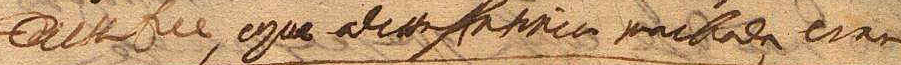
ditta Ree, e que a ditta Antonia machada eram
